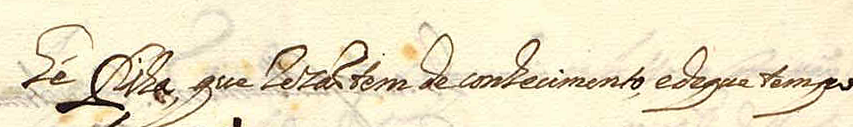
hé filha, que Rezaõ tem de conhecimento, e de que tempo
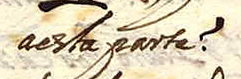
a esta parte?
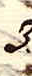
3.
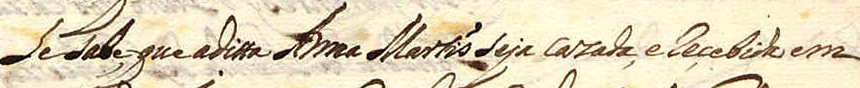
Se sabe, que a ditta Anna Martīs seja cazada, e Recebida em
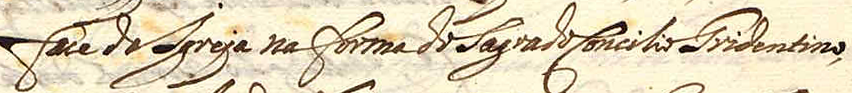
face da Igreja na forma do Sagrado Concilio Tridentino,
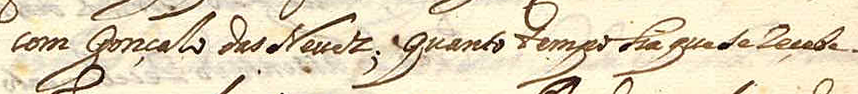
com Gonçalo das Neuez; quanto tempo há que se Recebe
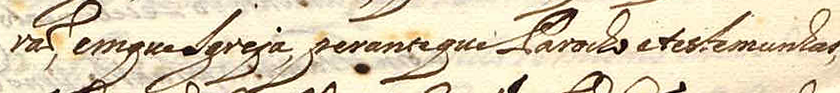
raõ, em que Igreja, perante que Parocho e testemunhas,
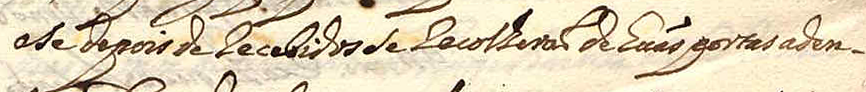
e se depois de Recebidos se Recolheraõ de huās portas aden
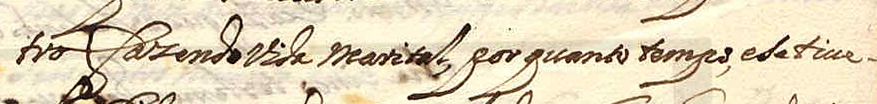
tro fazendo vida marital, porquanto tempo, e se tiue
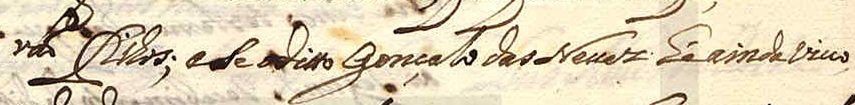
raõ filhos; e se o ditto Gonçalo das Neuez hé ainda viuo
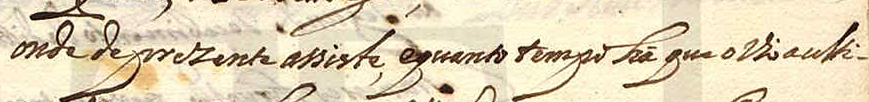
onde de prezente assiste, e quanto tempo há que o Vio a ulti
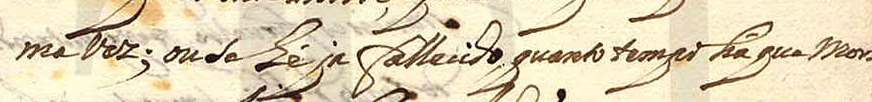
ma vez; ou se hé ja fallecido, quanto tempo há que mor
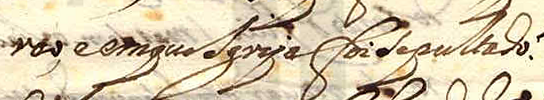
reo, e em que Igreja foi sepultado?
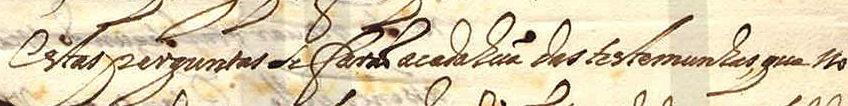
Estas perguntas se faraõ a cada huā das testemunhas, que no
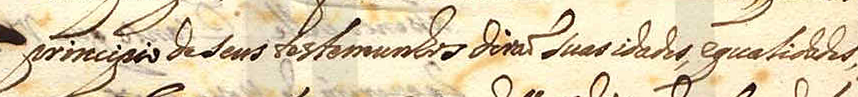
principio de seus testemunhos diraõ suas idades, e qualidades,
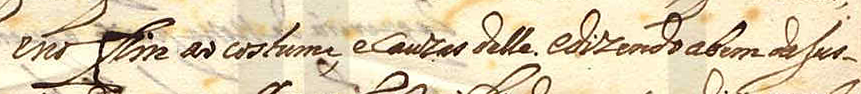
e no fim ao costume, e cauzas delle, e dizendo a bem da jus
